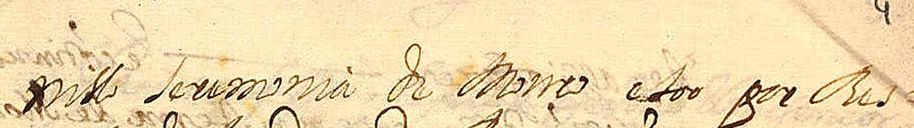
nisso seremonia de mouro e soo por Res
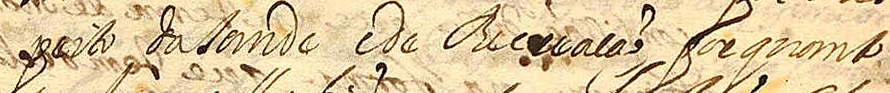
peito da saude e de Recreaçaõ porquanto
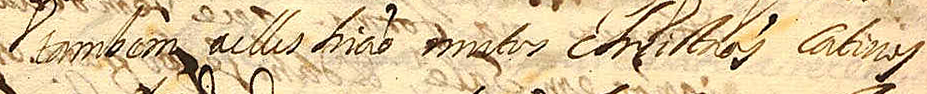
tambem a elles hiaõ mutos christaõs catiuos
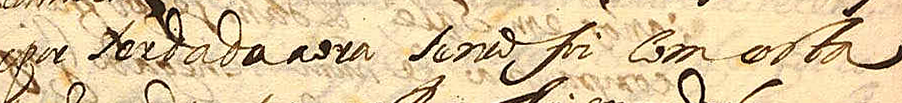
e por ser dada a ora se naõ foi com esta
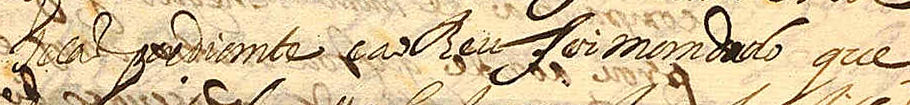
seçaõ por diante e ao Reu foi mandado que
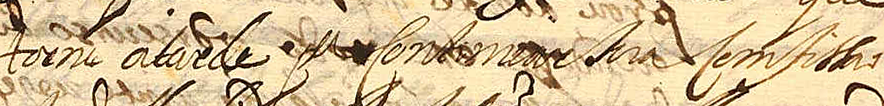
torne a tarde pa Continuar sua Comfissaõ
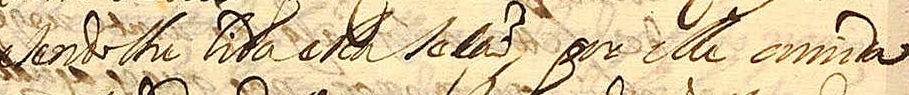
e sendolhe lida esta seçaõ, por elle ouuida
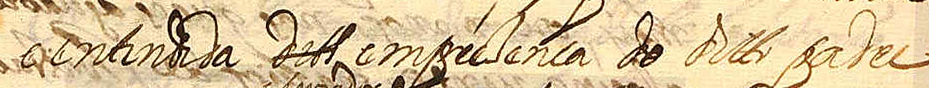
e entendida diss em presença do ditto padre
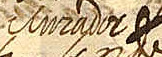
e curador
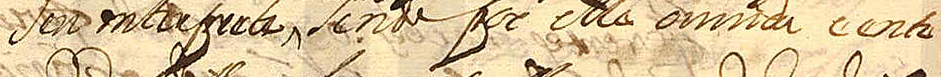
seu interprete sendo por elle ouuida e ente
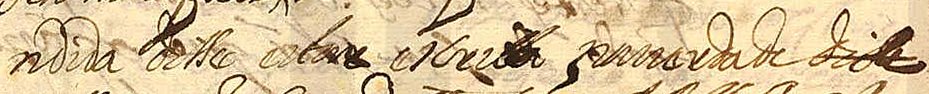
ndida disse estar escritta na uerdade disse
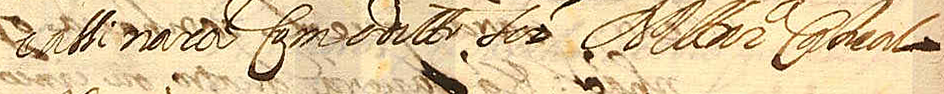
e assinaraõ Com o ditto sor̄ Bar txra Cabral
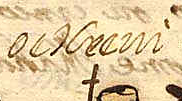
o escreui.
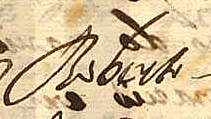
Roberto
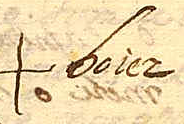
boier
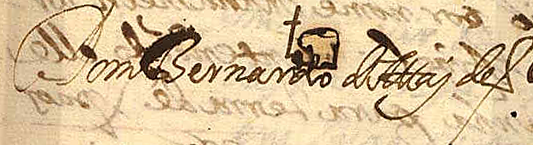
Dom Bernardo dAttajde
